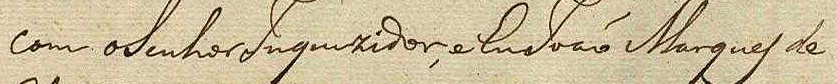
com o Senhor Inquizidor, e Eu Ioaõ Marques de
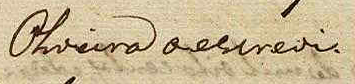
Oliveira o escrevi.
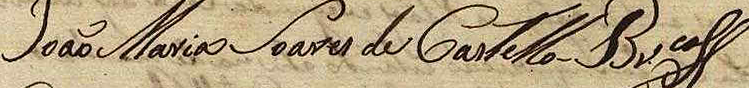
Ioaõ Maria Soares de Castello Br.co
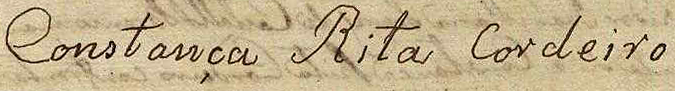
Constança Rita Cordeiro
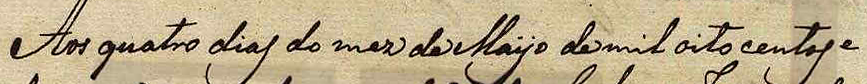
Aos quatro dias do mez de Mayo de mil oitocentos e
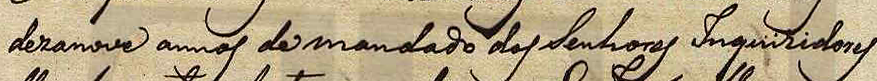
dezanove annos de mandado dos Senhores Inquizidores
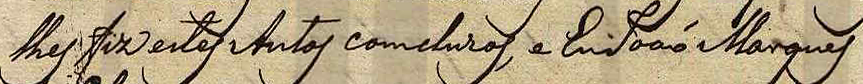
lhes fiz estes Autos comcluzos, e Eu Ioão Marques
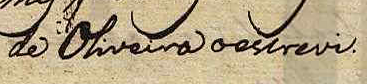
de Oliveira o escrevi.
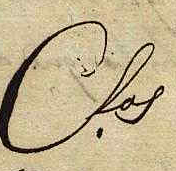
C.Los
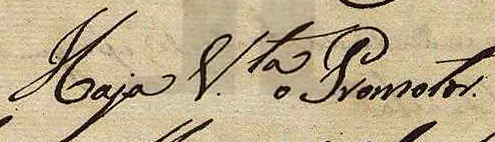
Haja V.ta o Promotor
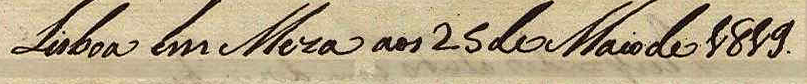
Lisboa em Meza aos 25 de Maio de 1819.
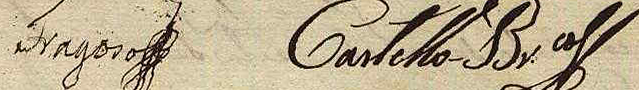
Fragoso Castello Br.co
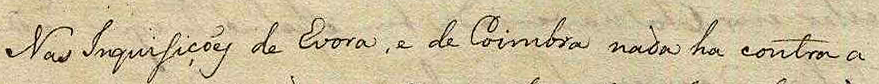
Nas Inquisiçoẽs de Evora, e de Coimbra nada ha contra a
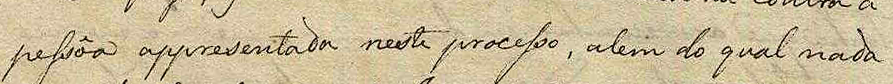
pessôa appresentada neste processo, alem do qual nada
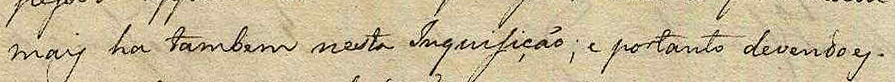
mais ha tambem nesta Inquisiçaõ; e portanto devendo es
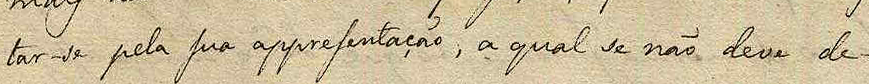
tar-se pela sua appresentaçaõ, a qual se naõ deve de
